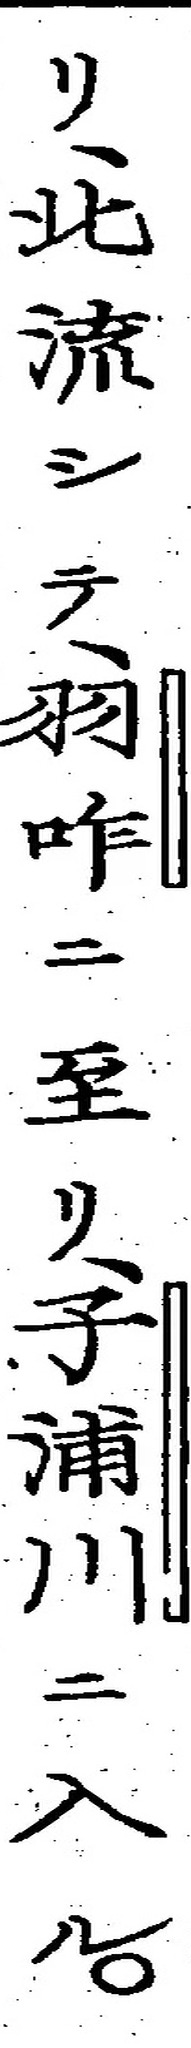リ、北流シテ、羽咋ニ至リ、子浦川ニ入ル。
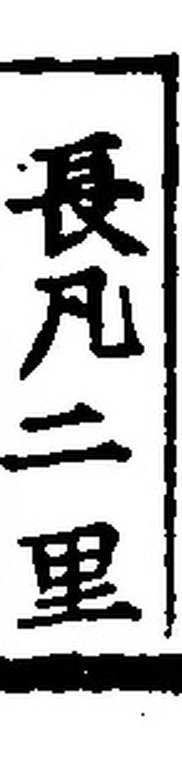長凡二里
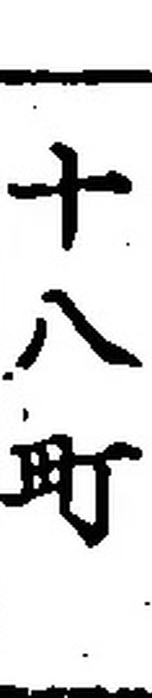十八町
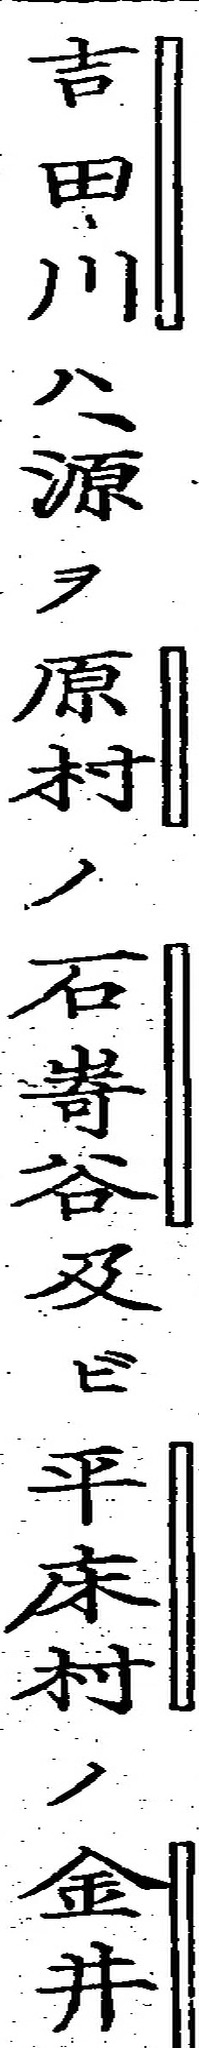吉田川ハ、源ヲ原村ノ石崎谷及ビ平床村ノ金井
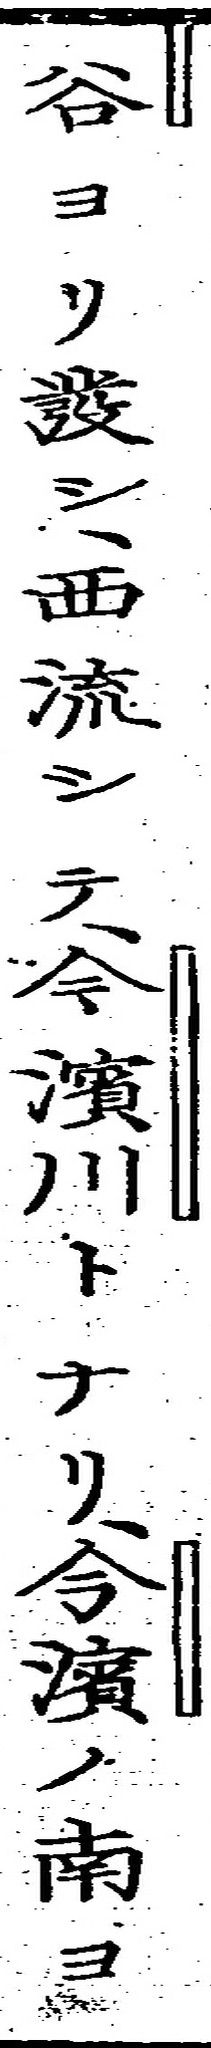谷ヨリ発シ、西流シテ、今浜川トナリ、今浜ノ南ヨ
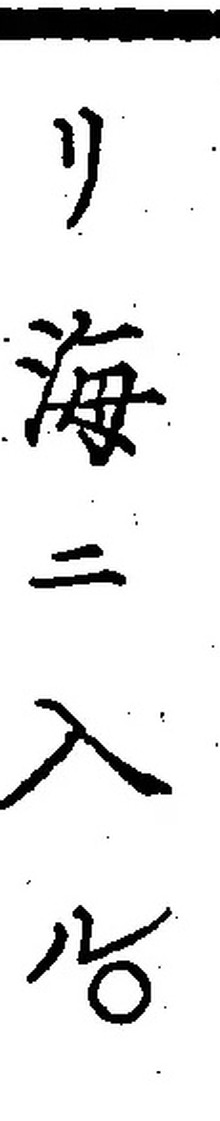リ海ニ入ル。
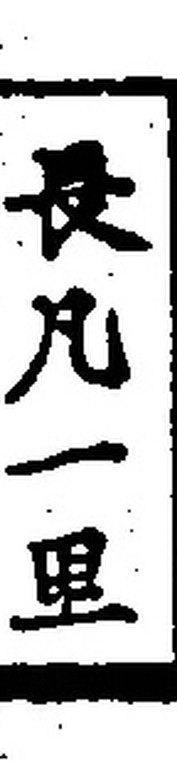長凡一里
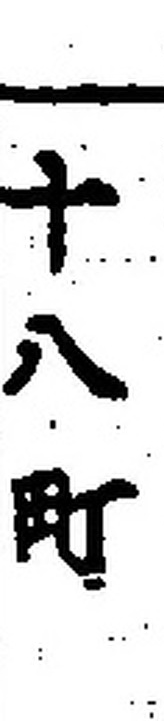十八町
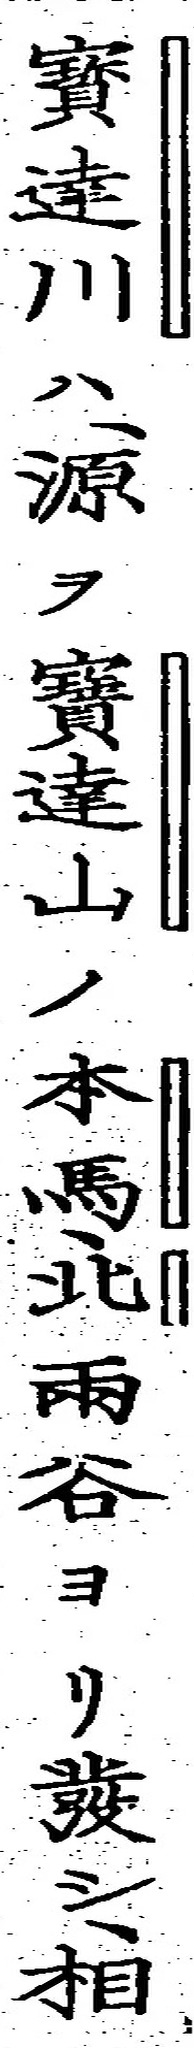宝達川ハ、源ヲ宝達山ノ本馬・北両谷ヨリ発シ、相
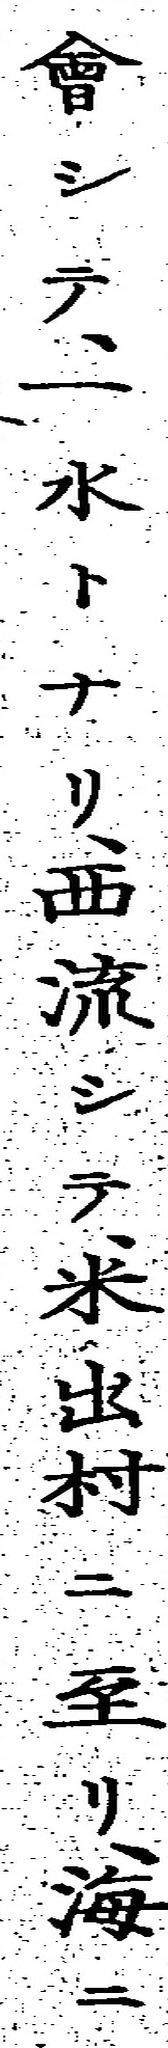会シテ、一水トナリ、西流シテ、米出村ニ至リ、海ニ
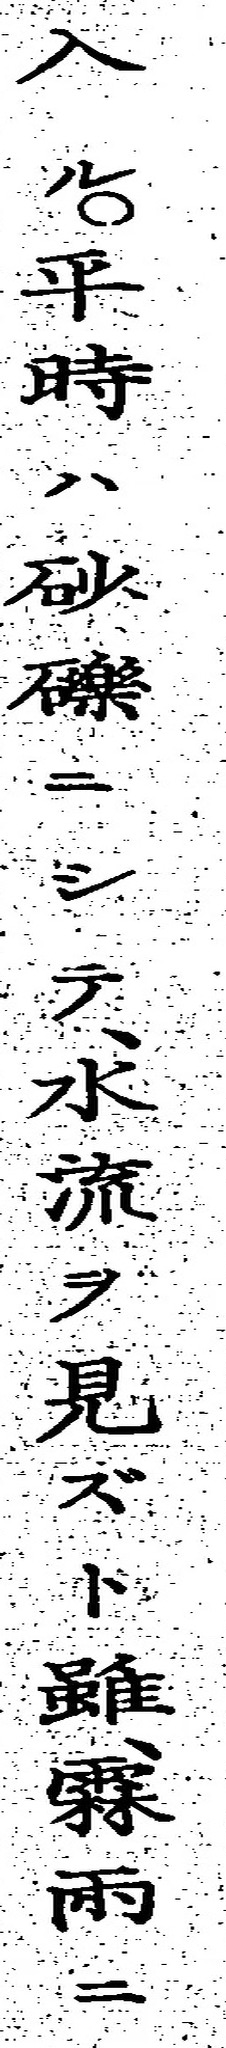入ル。平時ハ砂礫ニシテ、水流ヲ見ズト雖、霖雨ニ
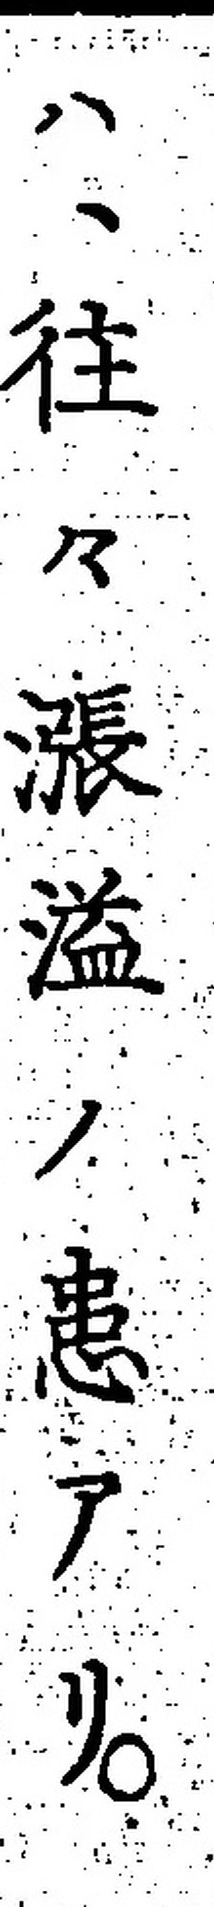ハ、往々漲溢ノ患アリ。
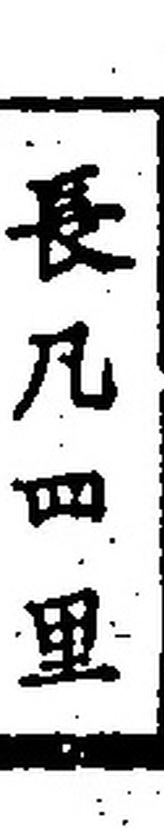長凡四里
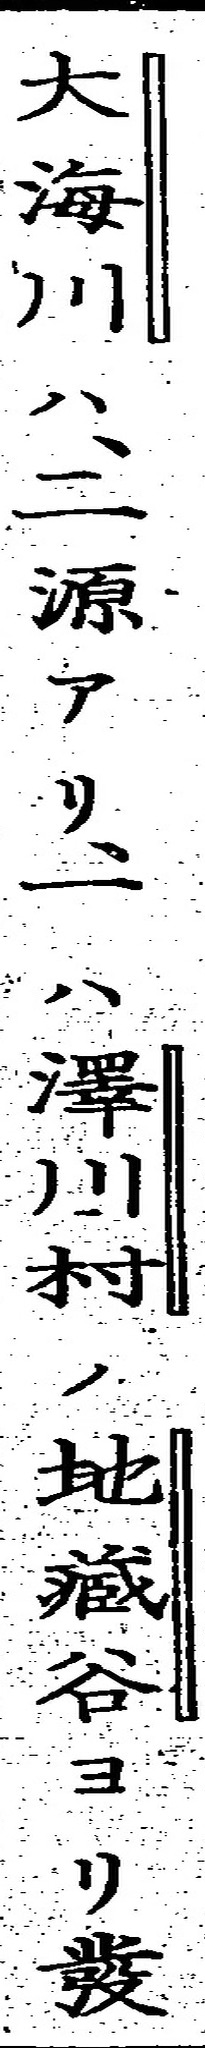大海川ハ、二源アリ、一ハ沢川村ノ地蔵谷ヨリ発
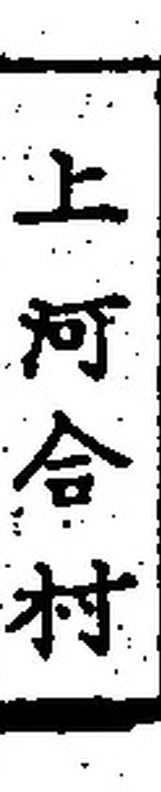上河合村
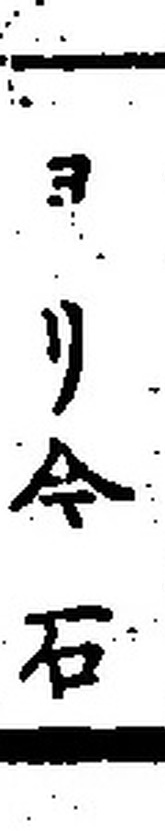ヨリ今石
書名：能登地誌略
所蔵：国立国会図書館 National Diet Library, JAPAN
